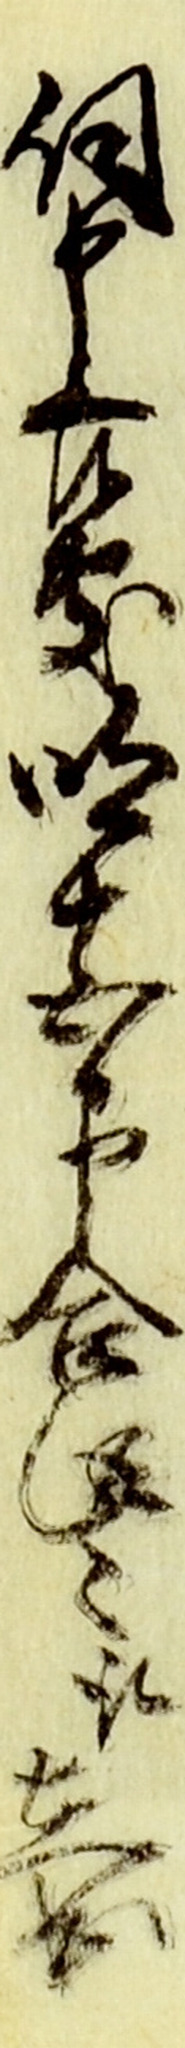伺申上候処明十五日申合趣々江在出
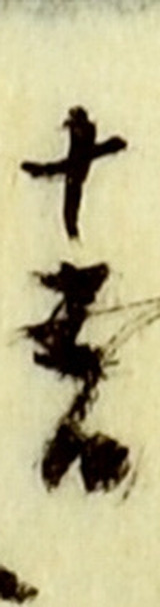十五日
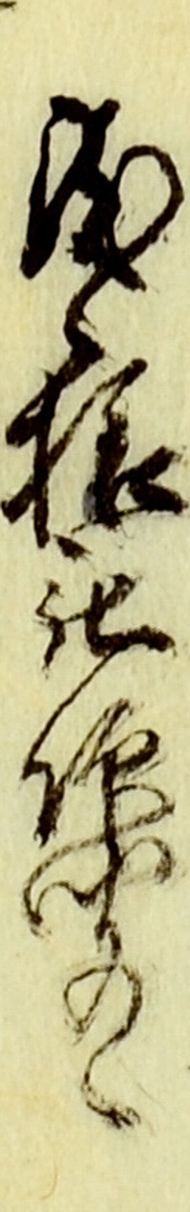致候様被仰聞候
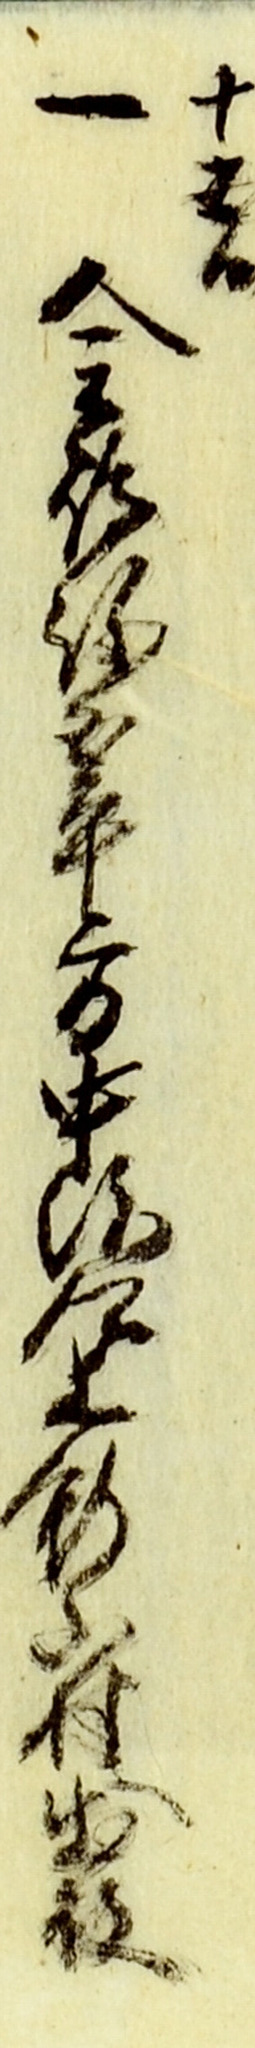一金嶋弥五平方中沢郷上新山村へ出役
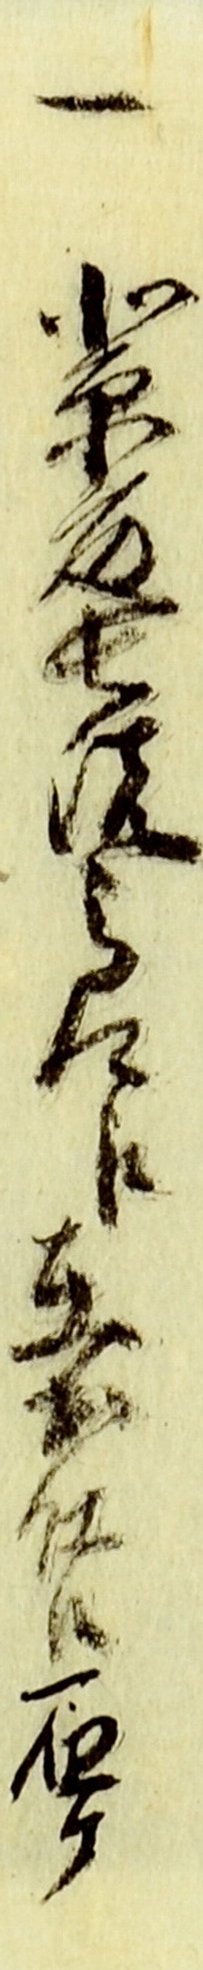一北原藤七洗馬郷江在出仕候届ケ
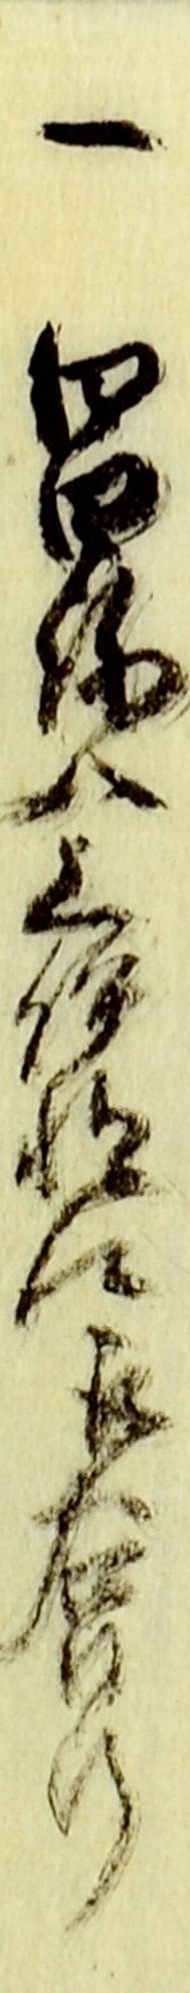一畠弥八上伊那郷江右同断
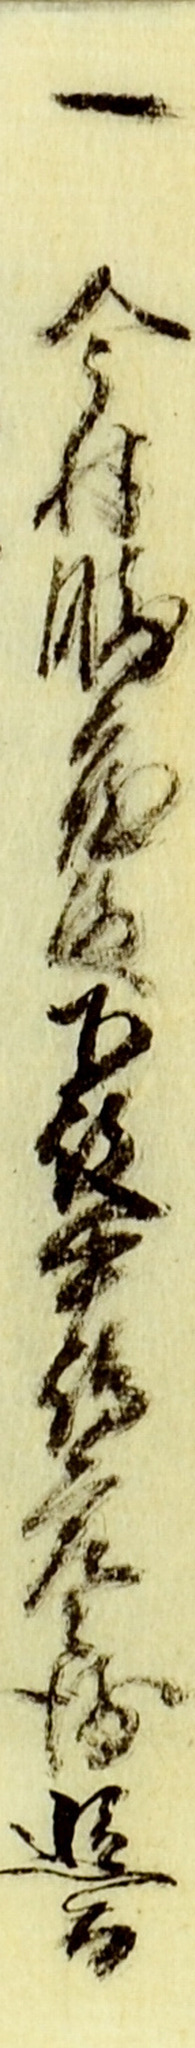一今村勝蔵殿下役中嶋彦兵衛追而
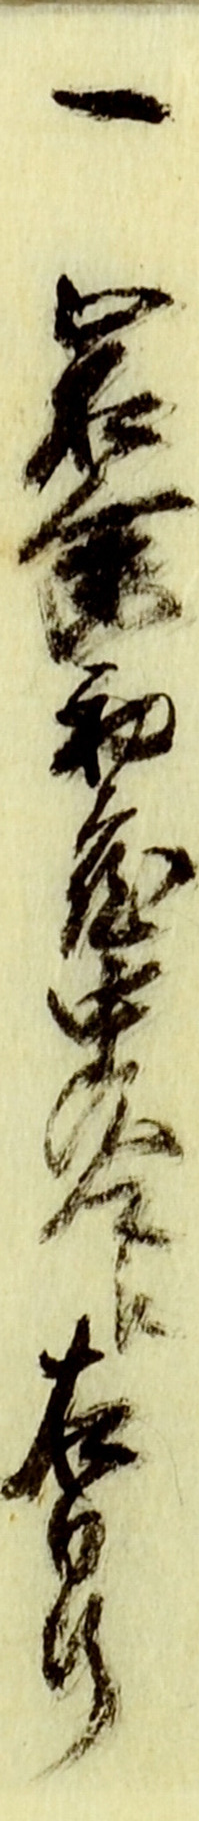一岩垂初蔵中沢郷江右同断
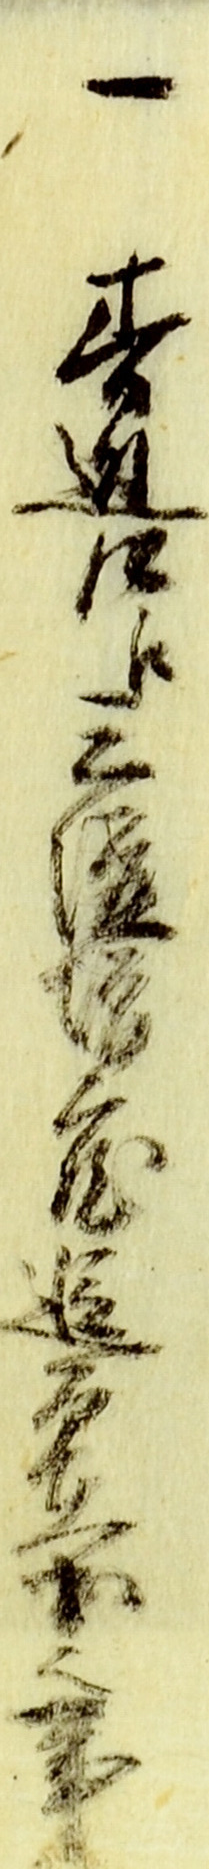一春近郷江三溝増蔵追而在出之事
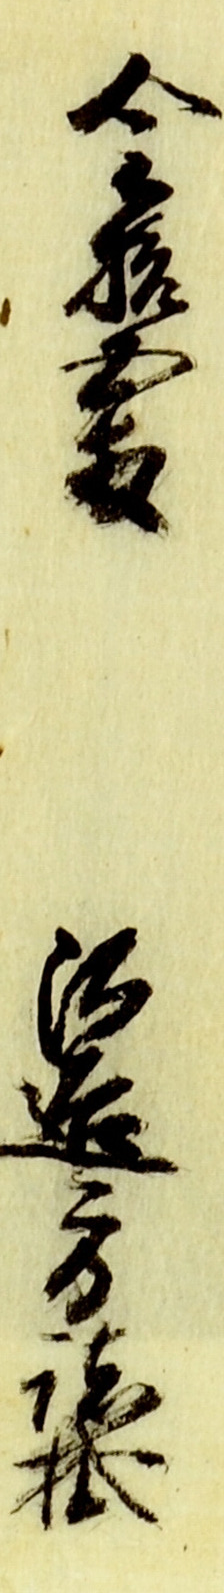金拾五両酒造方諸掛
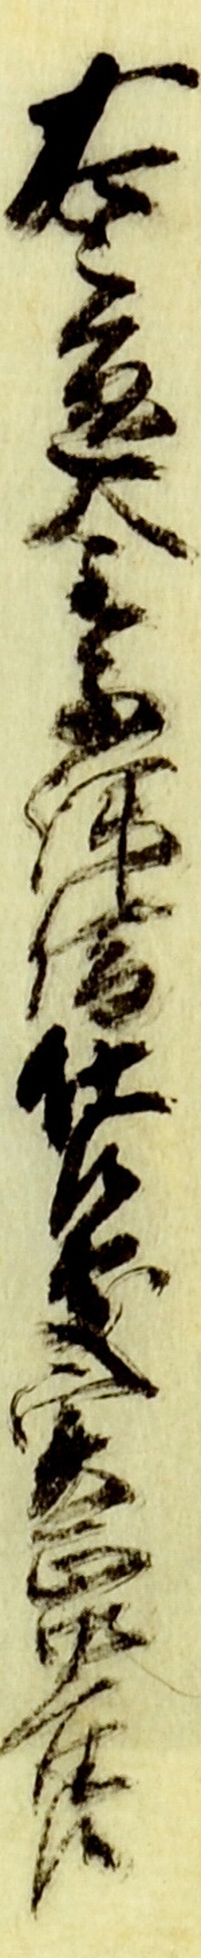右之通金子拝借仕候処実正御座候
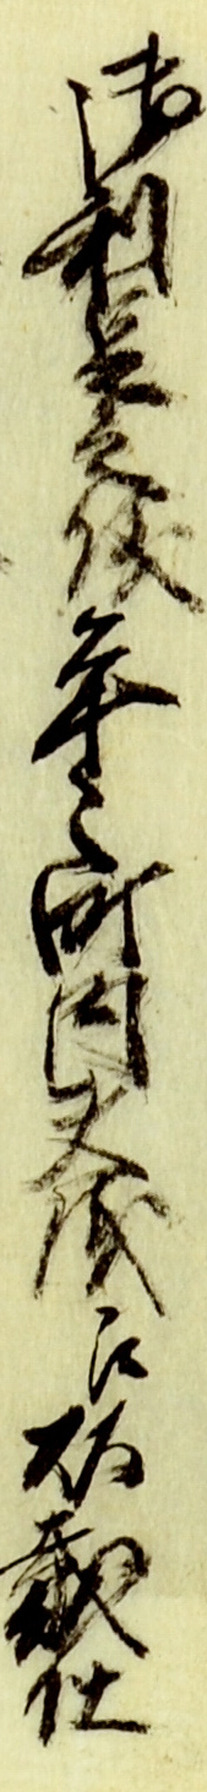御利足之儀年々町内夫銭江頂戴仕
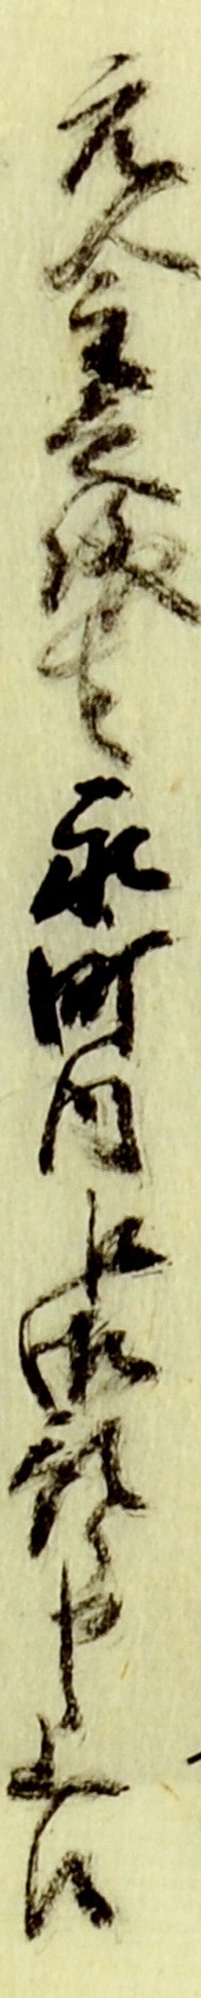元金之儀者永町内江御預り申上候
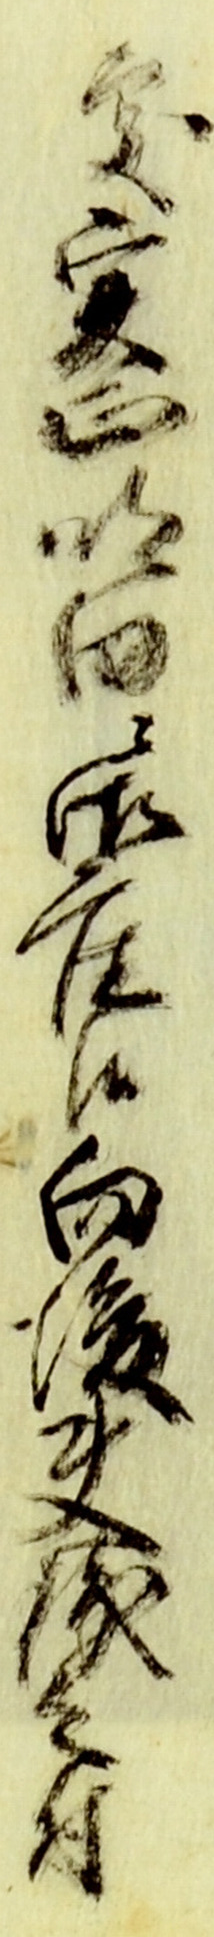処実正明白ニ御座候向後夫銭ニ付

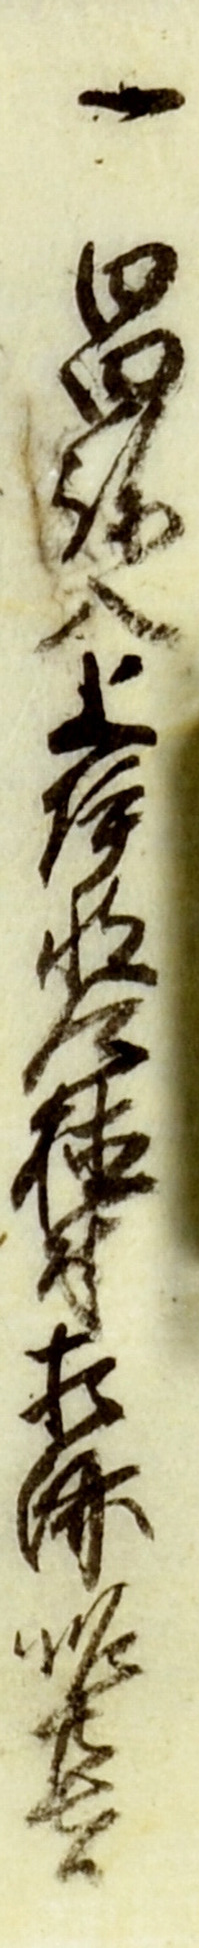一畠弥八上伊那郷植付相済昨廿六日
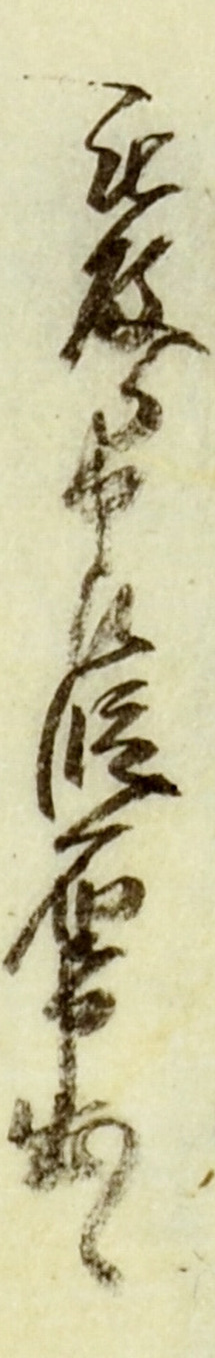罷帰り申候段届申出候
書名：諸事御用留
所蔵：伊那市立高遠町図書館・合同会社AMANE
